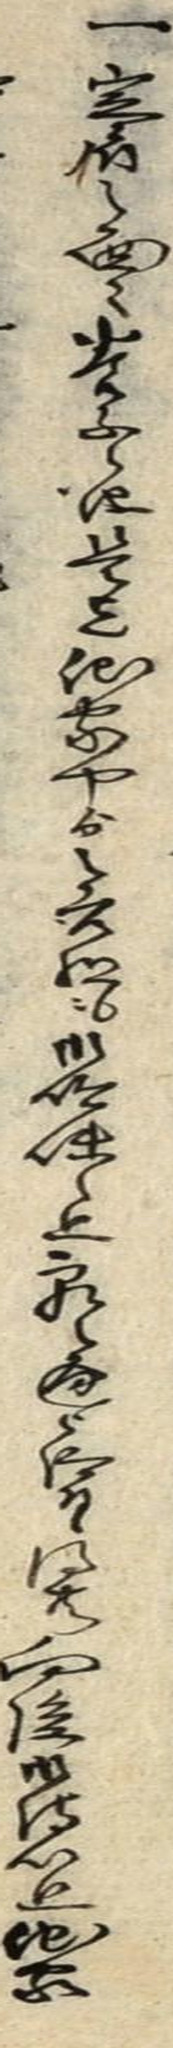一定府之面々養子之儀是迄他家中ゟ之取組も御吟味之上願之通被仰付候得共向後御侍以上他家
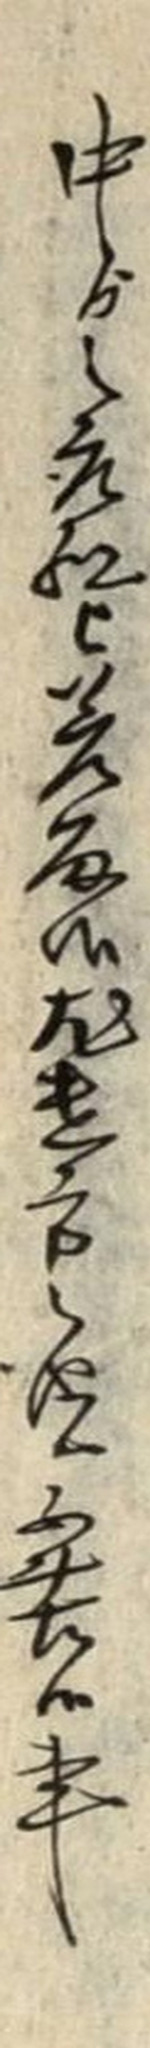中ゟ之取組被差留候尤遣方之儀ハ不苦候事
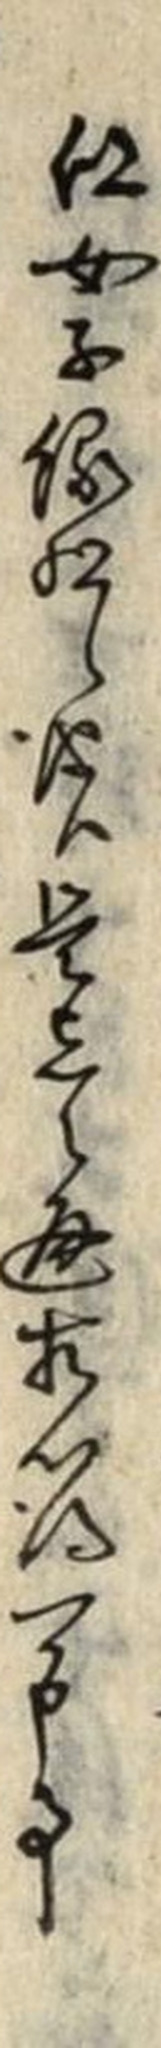但女子縁組之儀ハ是迄之通相心得可申事
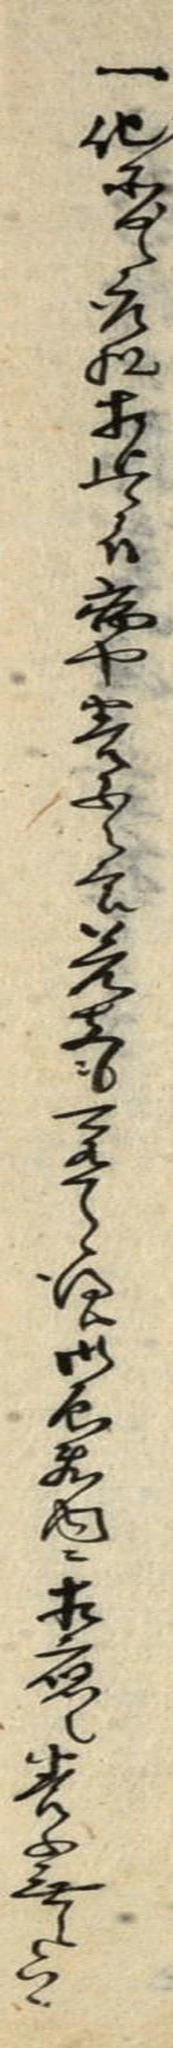一他所ゟ之取組相止候ニ付病中養子之節差支も可有之候得共御屋敷内ニ相応之養子無之候ハヽ

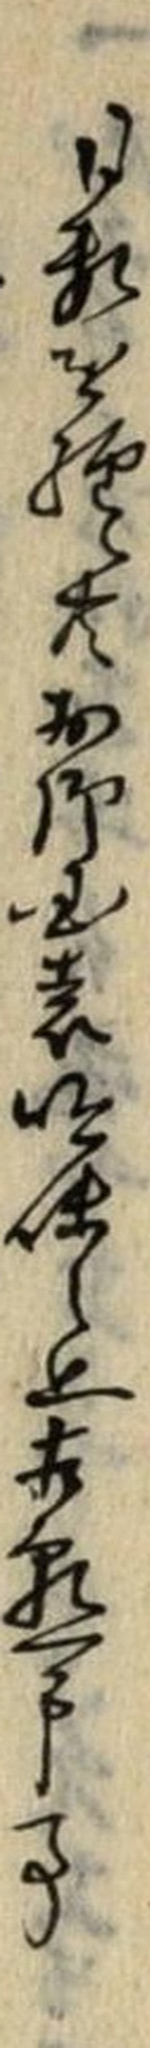日数を経候共於御国表吟味之上相願可申事
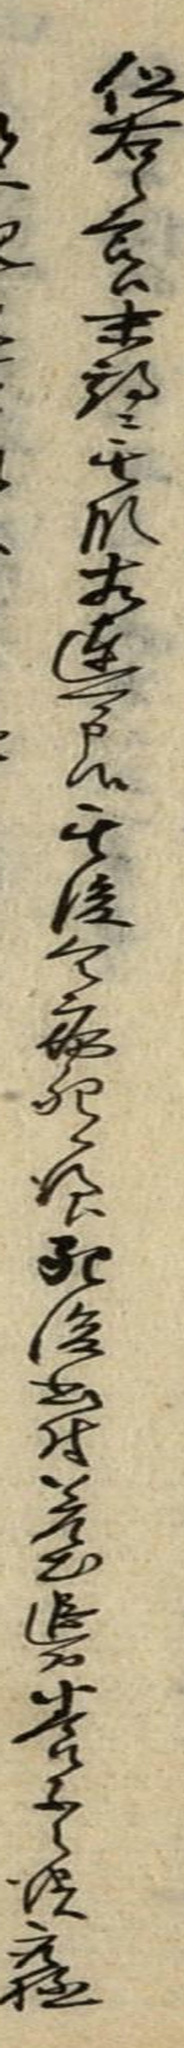但右之節ハ末期ニ其段相達可申候其後令病死候得ハ死後書付差出追而養子之儀ハ取極
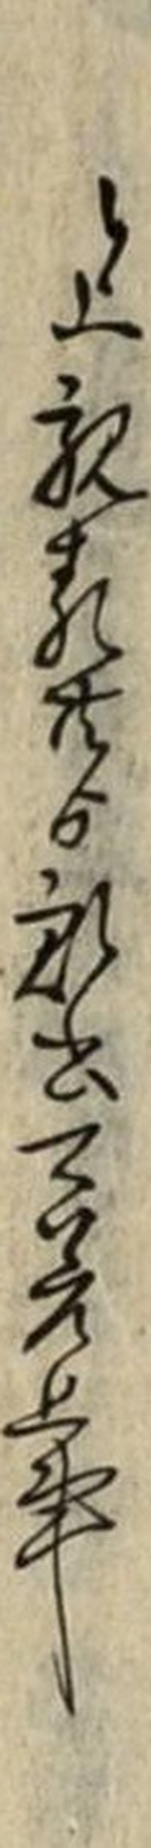之上親類共ゟ願書可差上事
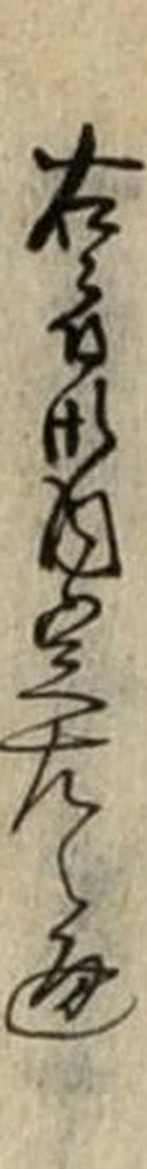右ニ付御内定左之通
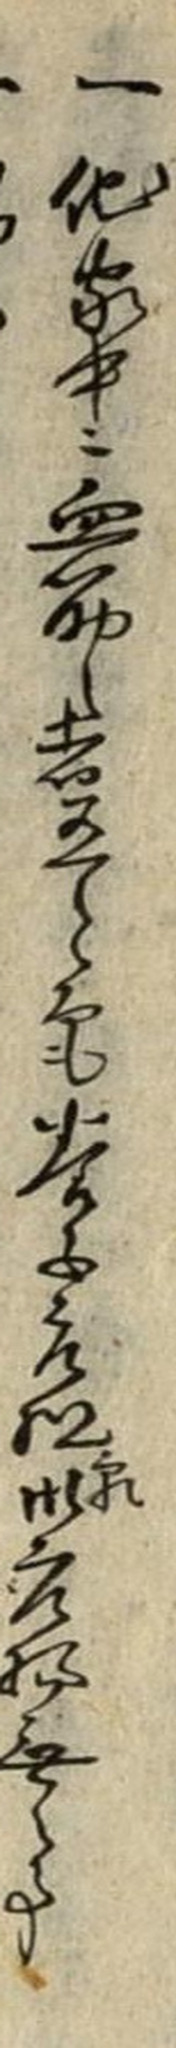一他家中ニ血筋之者有之候而も養子取組願御取揚無之事
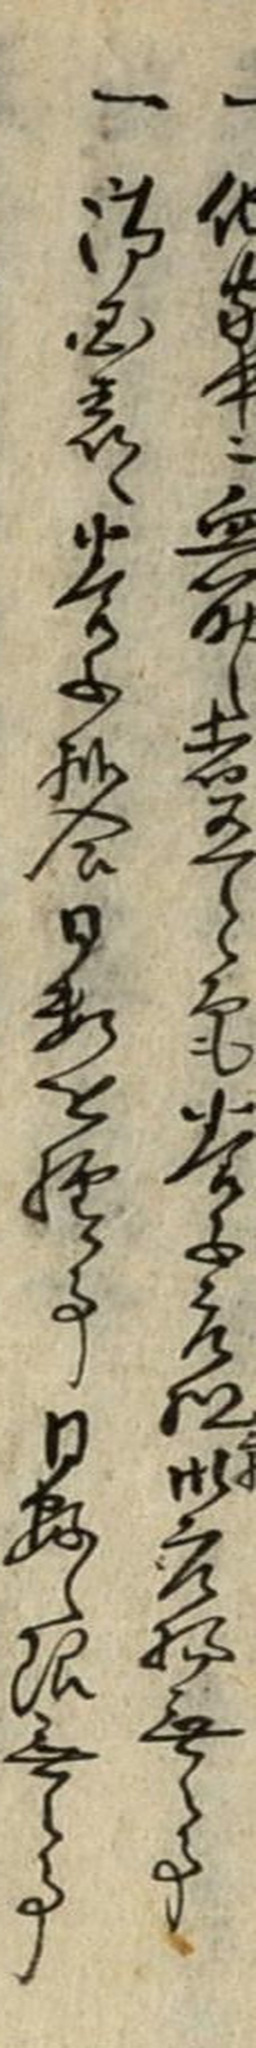一御国表へ養子掛合日数を経候事日数之限無之事
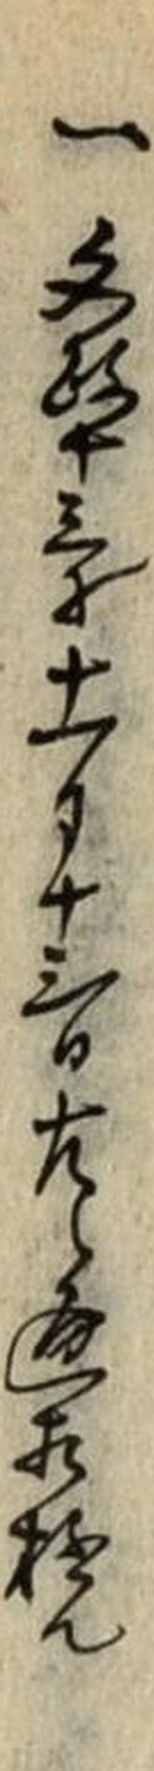一文政十三寅十一月十三日左之通相極ル
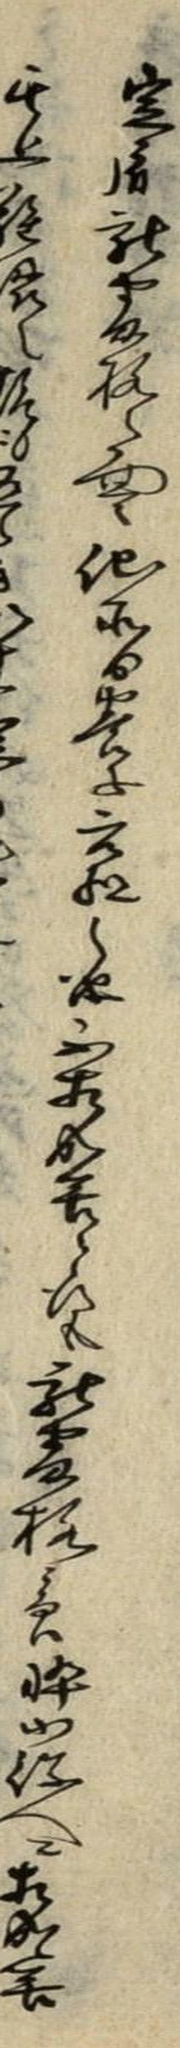定府新番格之面々他所ゟ養子取組之儀不相成筈ニ候得共新番格ニ而ハ忰小役人ニ相成候筈
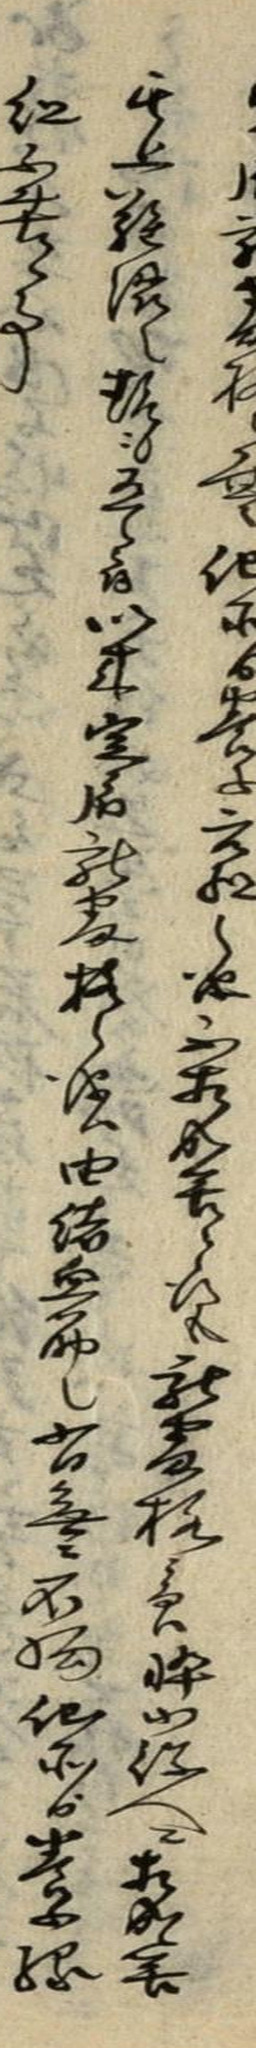其上難渋之趣も有之ニ付以来定府新番格之儀ハ由緒血筋之有無ニ不拘他所ゟ養子縁
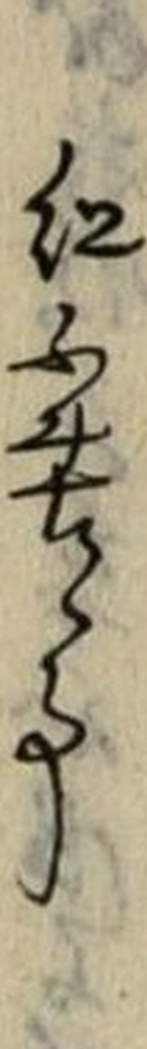組不苦候事
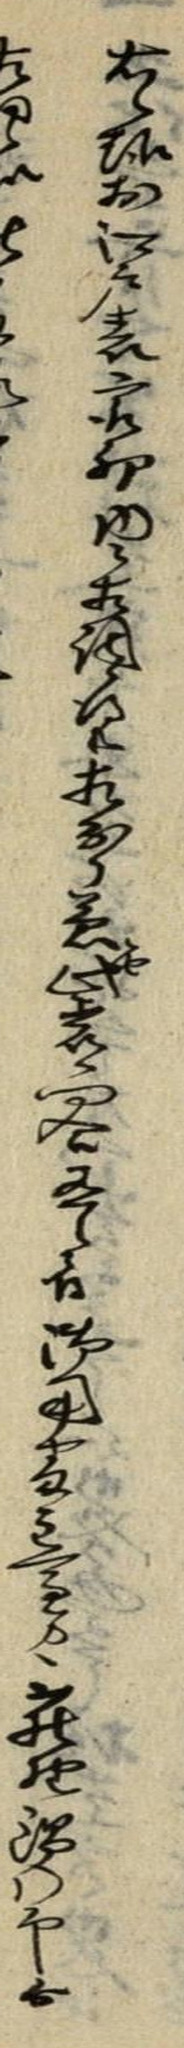右之趣於江戸表最初内々相調候得共相分り兼候由此表へ問合有之ニ付御用番主馬方へ荻野鍋八郎ゟ
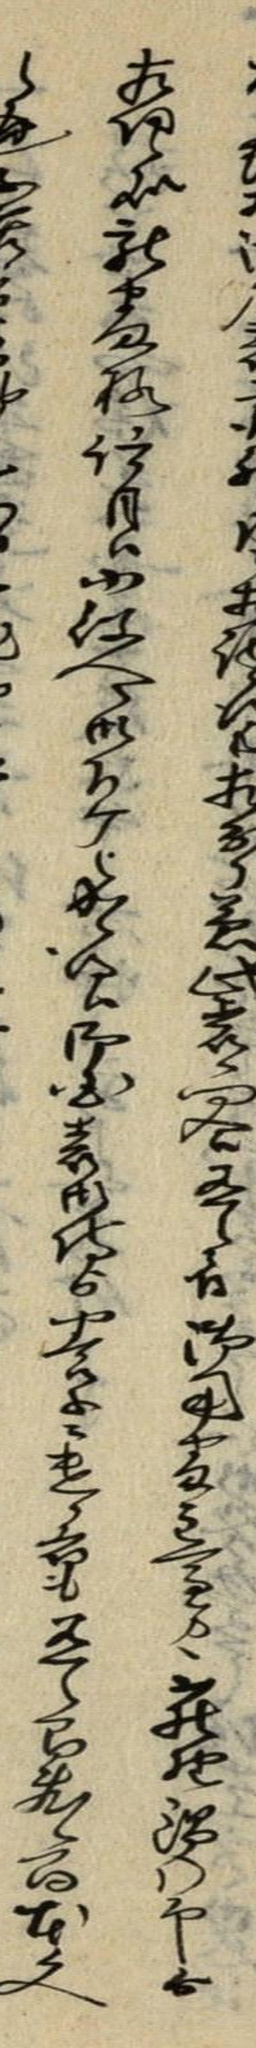相伺候処新番格跡目ハ小役人へ御下ケ被成候得ハ御国表御侍ゟ養子ニ遣候者も有之間敷候間本文
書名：養子縁組之部
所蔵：福井県文書館 Fukui Prefectural Archives
